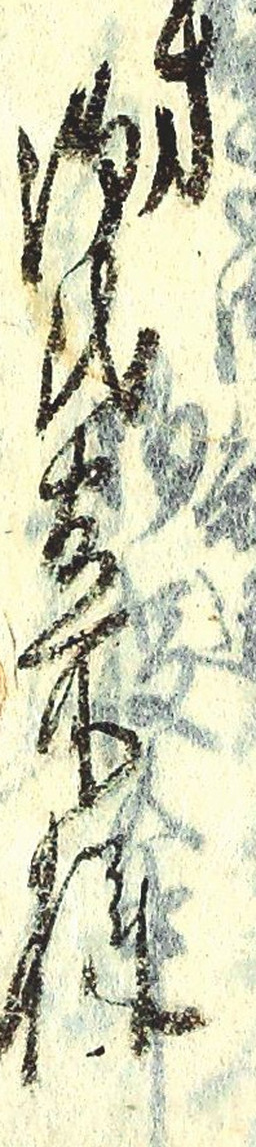御代官所様
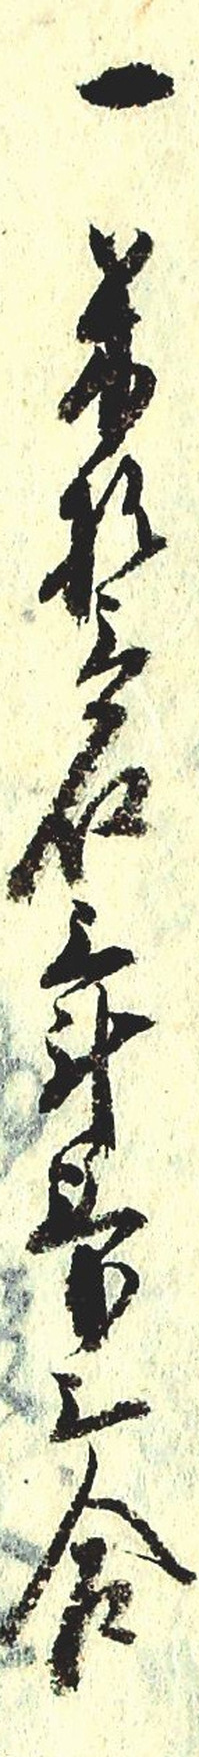一米拾三石三斗三升三合
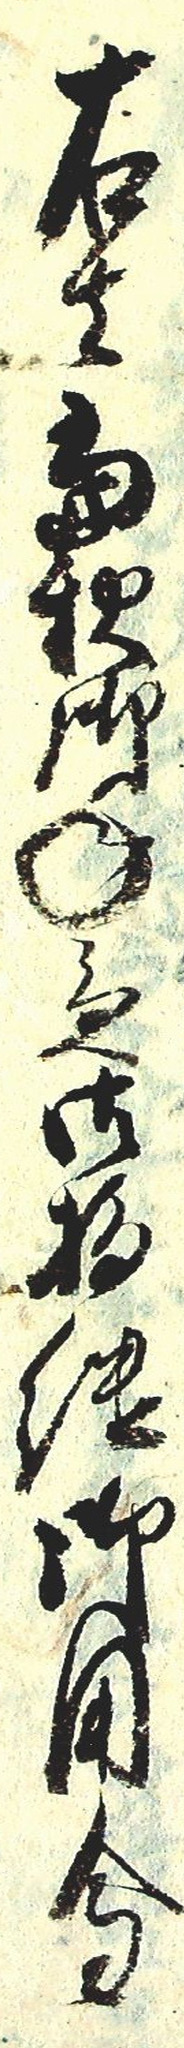右は当秋御年貢御指継御用金
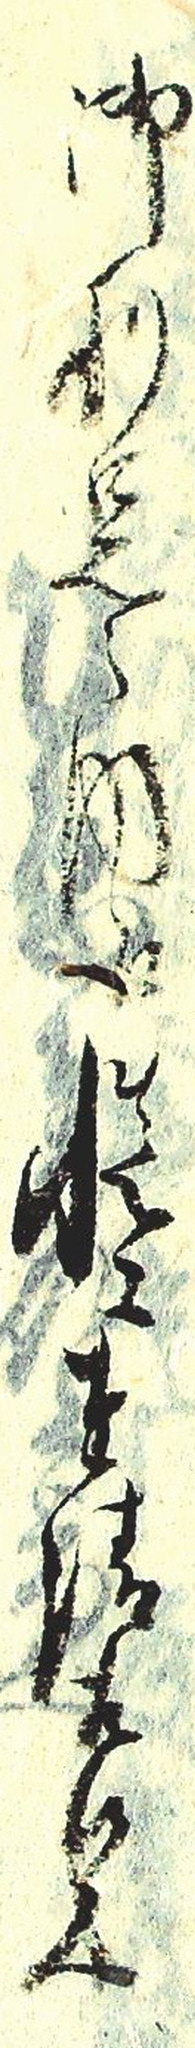御利息之内え慥に奉請取候以上
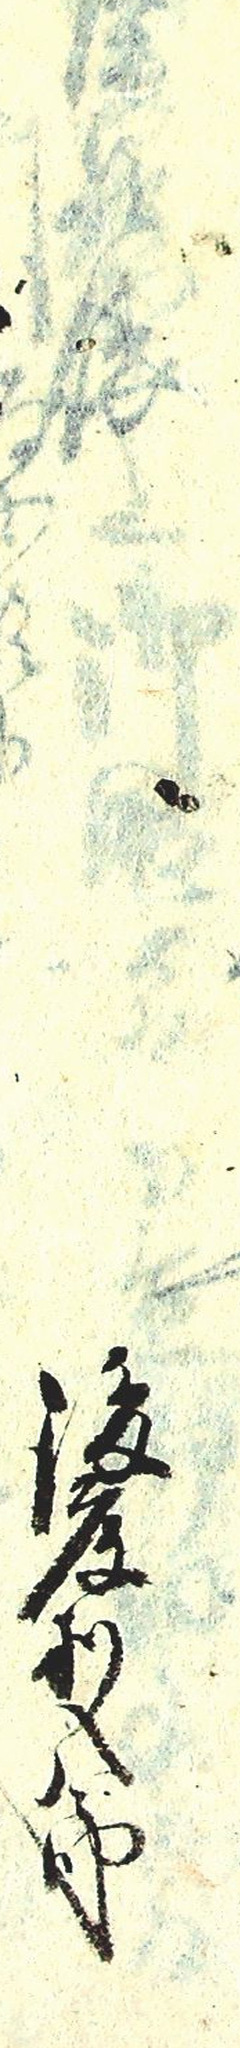後藤利八郎
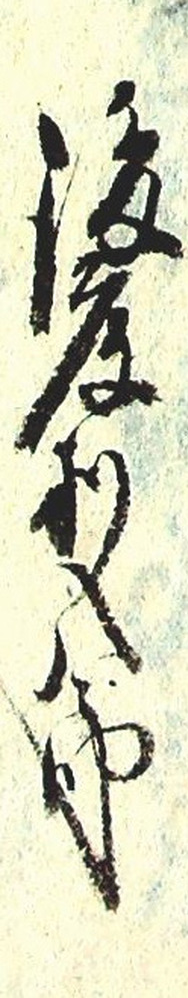後藤利八郎
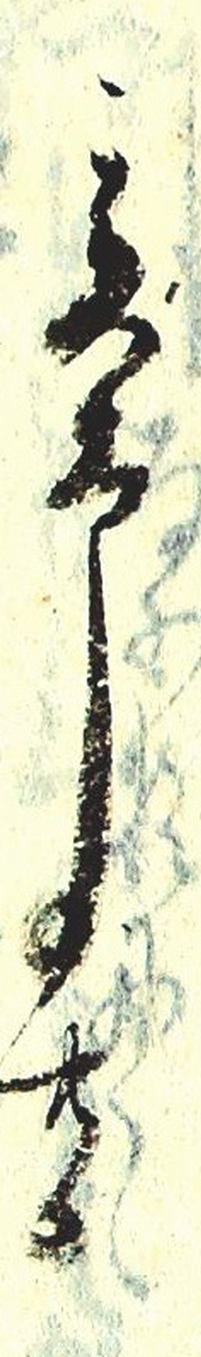亥十一月廿日
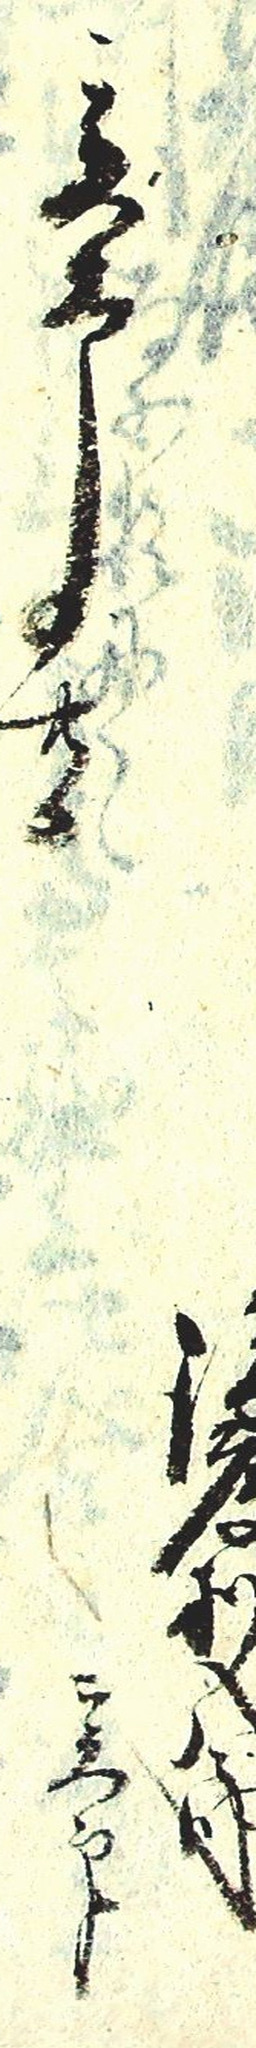亥十一月廿日
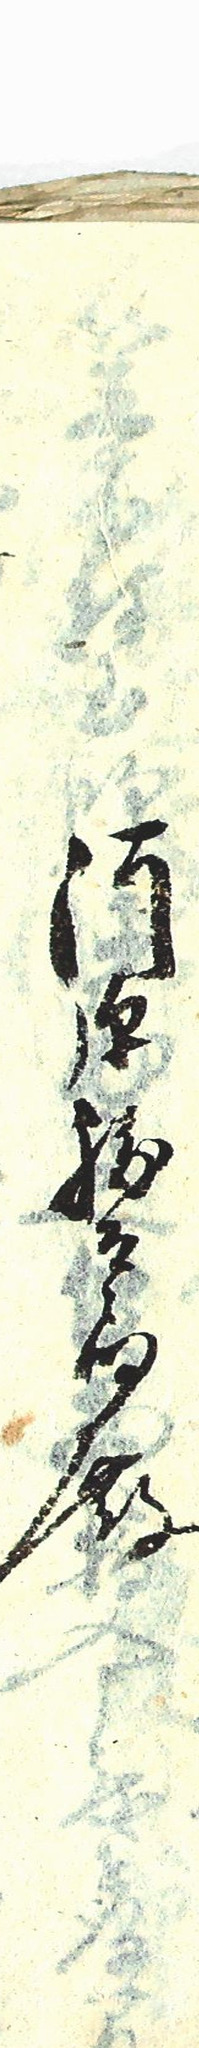河原勝太郎殿
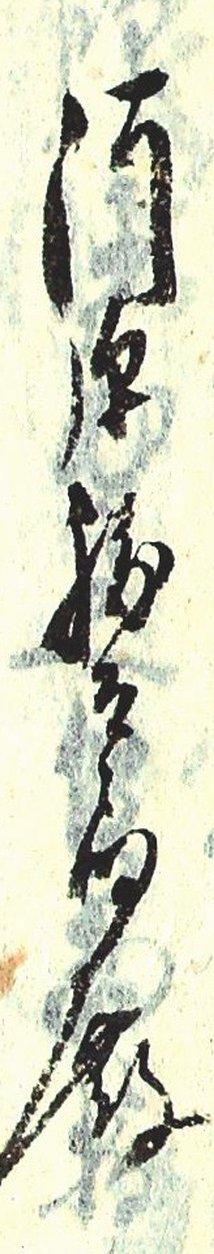河原勝太郎殿

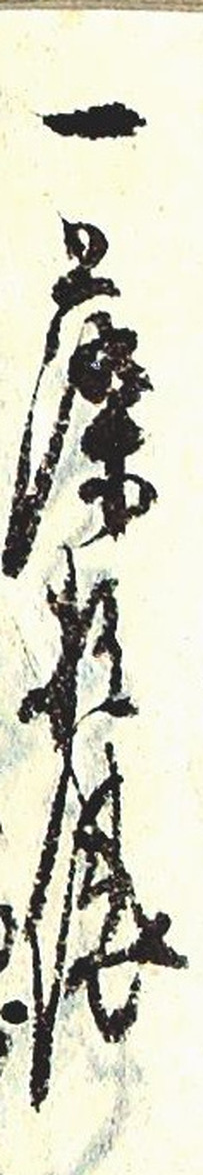一蒅拾俵
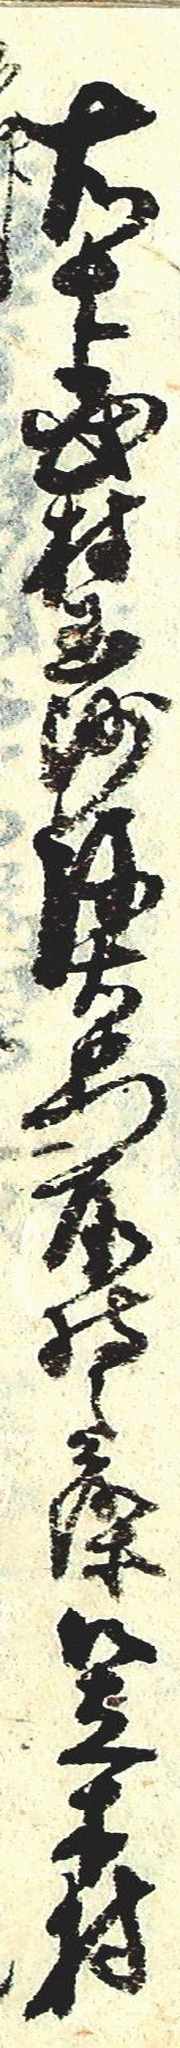右は当村玉師弥右衛門所持之蒅笠木村
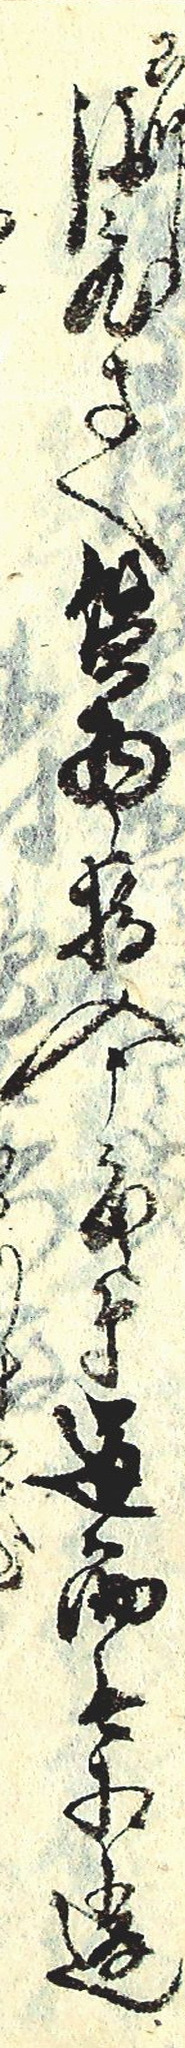弥蔵方へ質物に指入申度に付道筋無相違
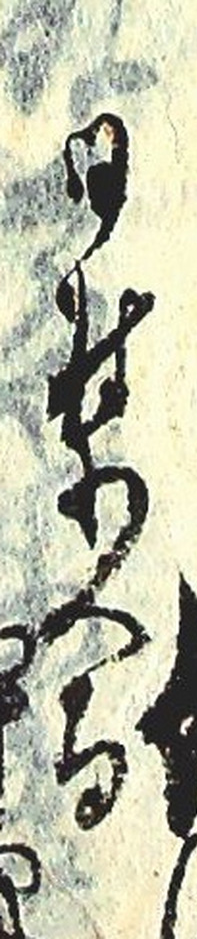同村五人与
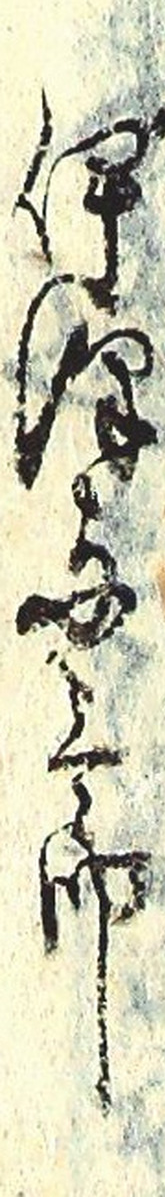伊沢与三郎
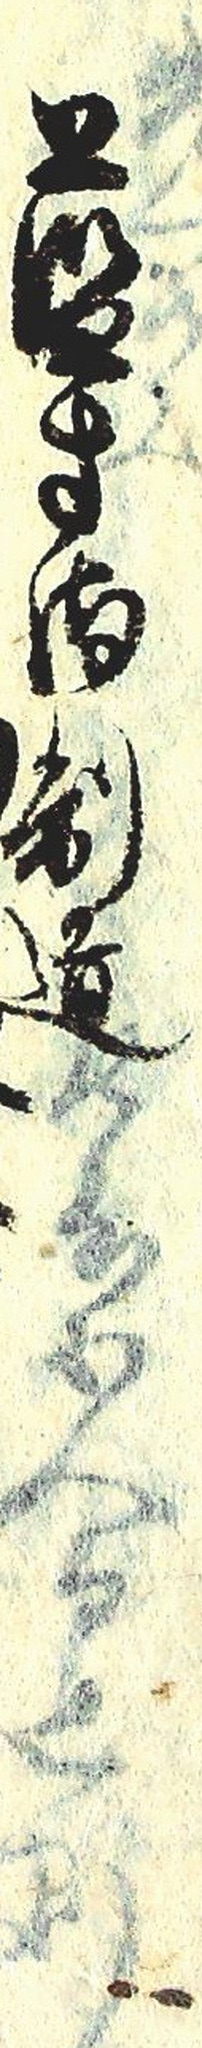藍方御制道
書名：諸御願書控(弐番）
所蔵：鳴門教育大学 Naruto University of Education
